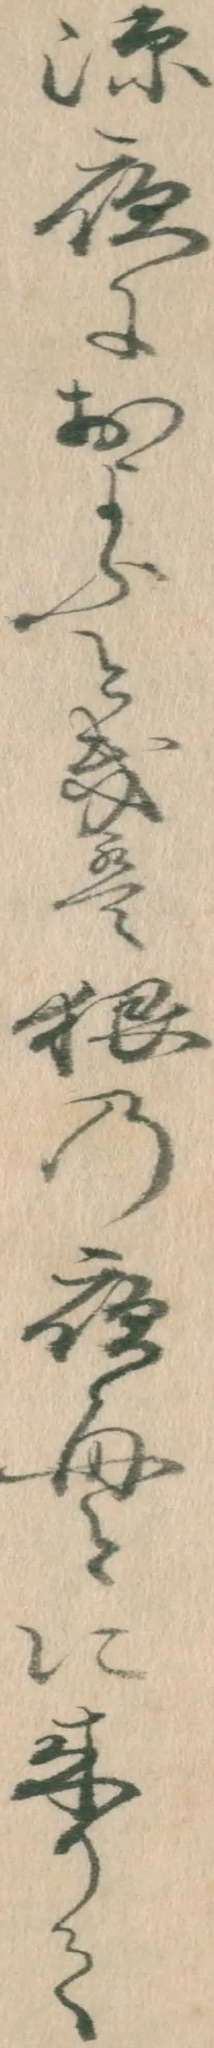深夜におよふときは狼の夜毎とに来りて
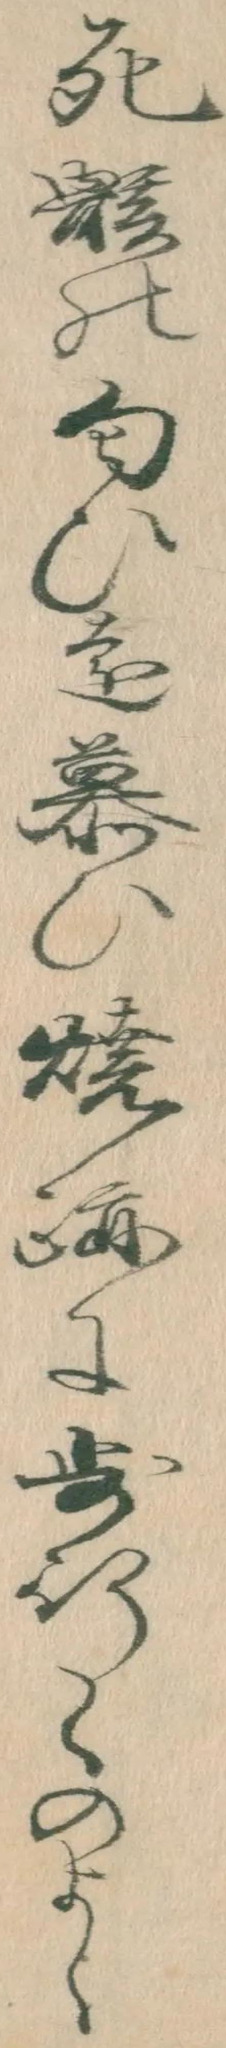死骸の匂ひを慕ひ焼跡に歩行くのよし
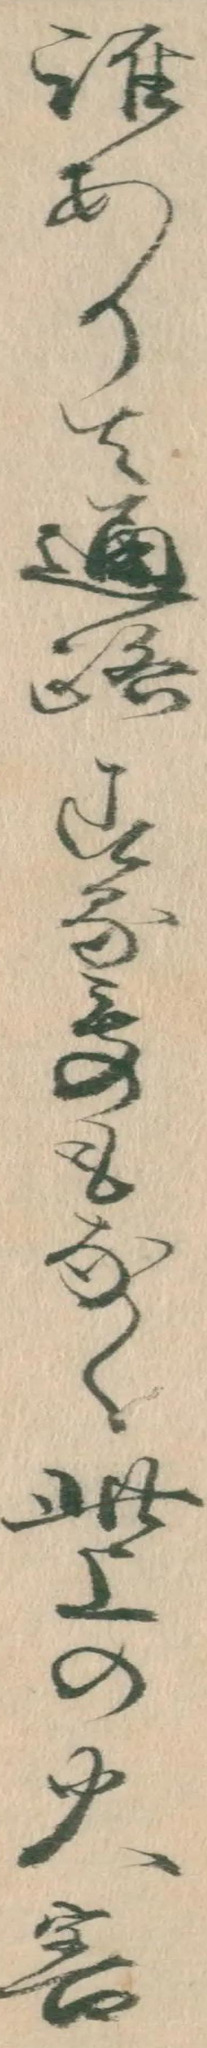誰ありて通路するものもなく此上の火害
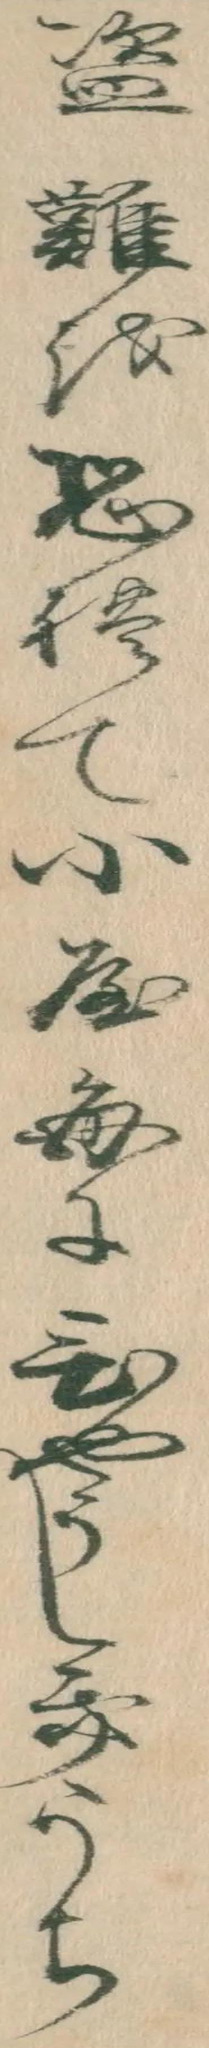盗難を恐れて小屋毎にひやうしきうち

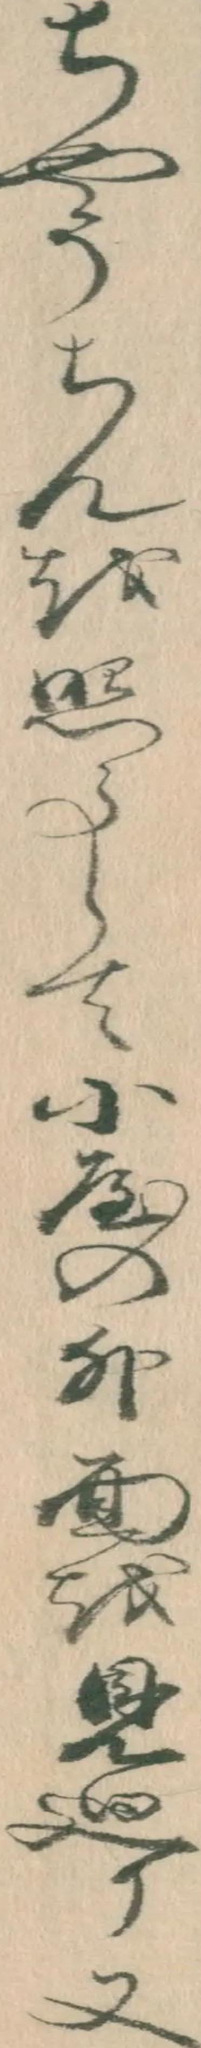ちやうちんを照らして小屋の外面を見廻り又
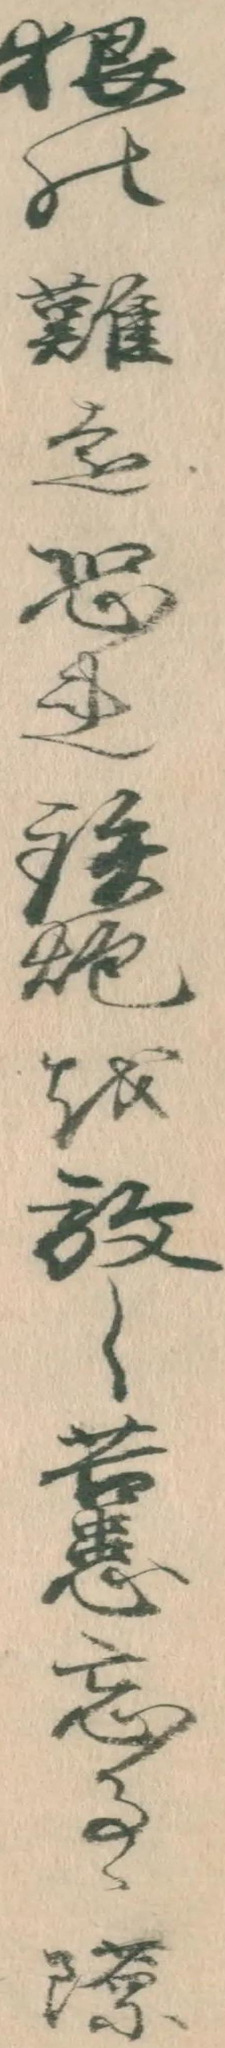狼の難を恐れ鉄砲を放し苦患忘るゝ隙
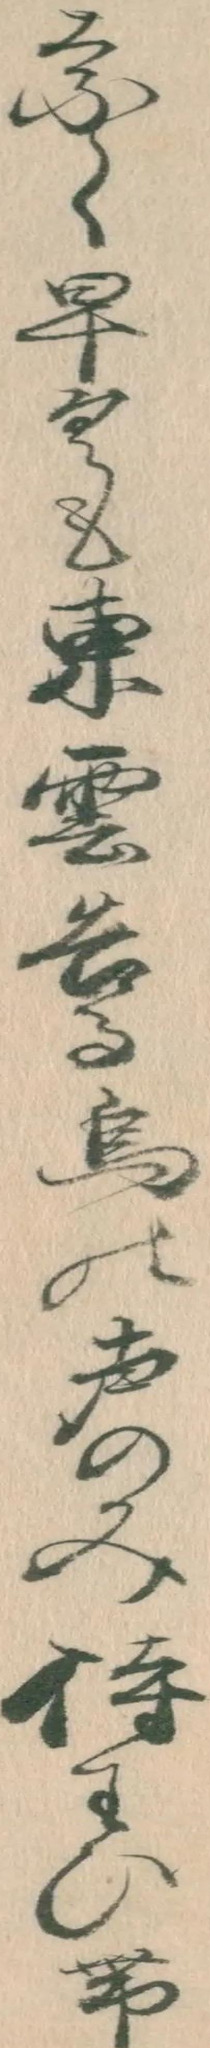なく早くも東雲告る鳥の声のみ待わひ帯
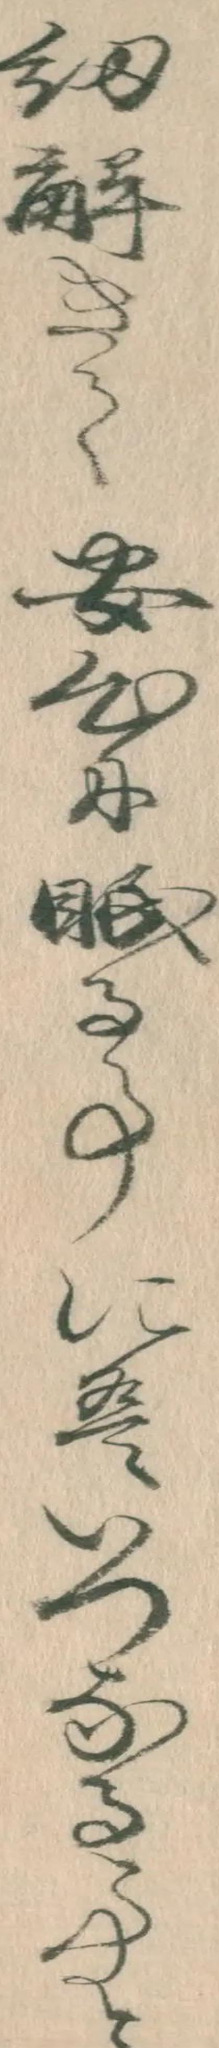紐解きて安心に眠る事にはいつなる事と
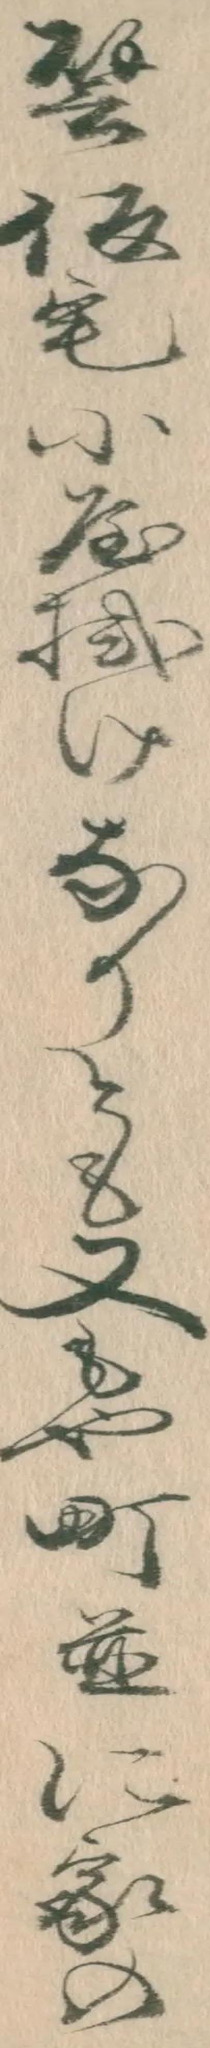譬仮宅小屋掛けなりとも又もや町並に家の
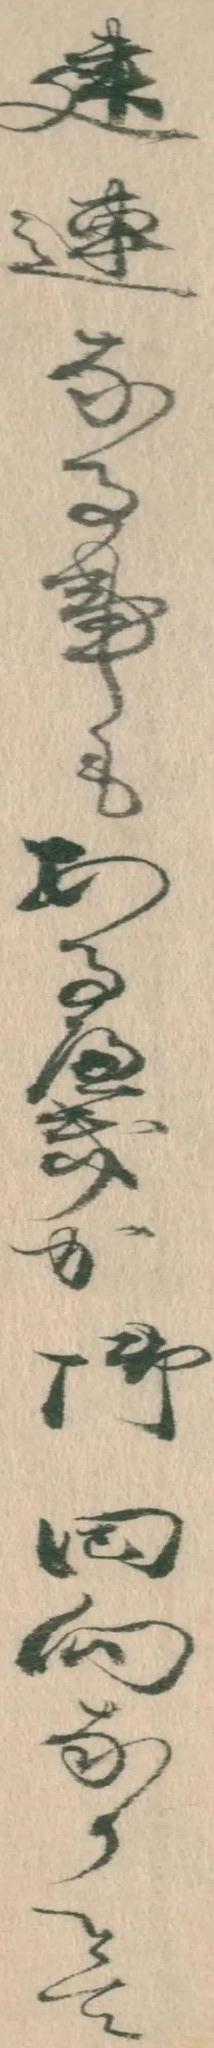建連なる事もあるへきか御回向なりとて
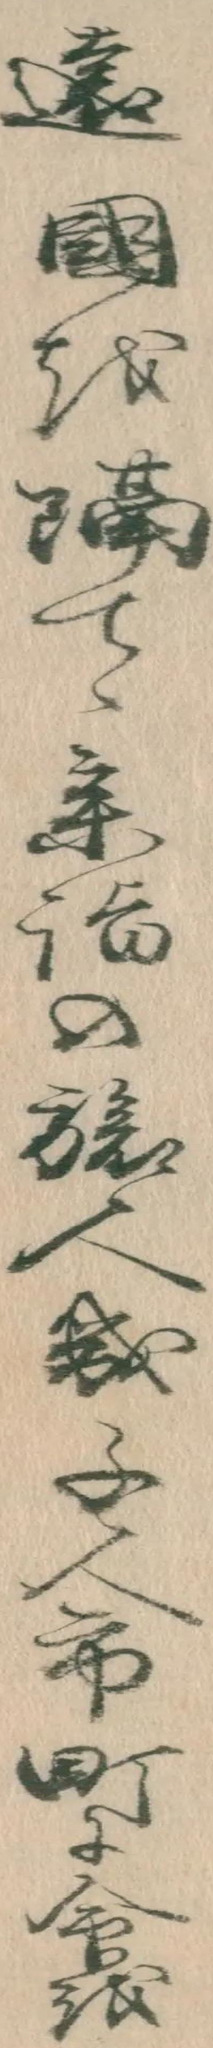遠国を隔てゝ参詣の旅人幾千人市町に命を
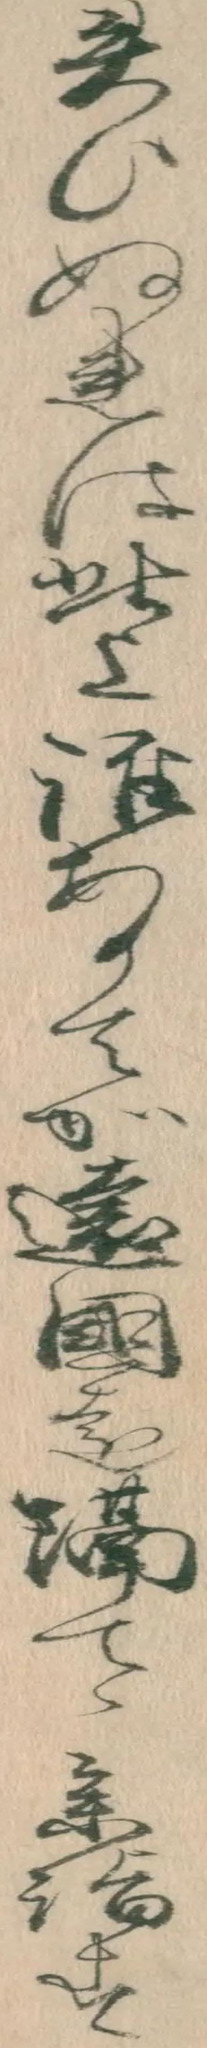失ひぬれは此上誰ありてか遠国を隔てゝ参詣す
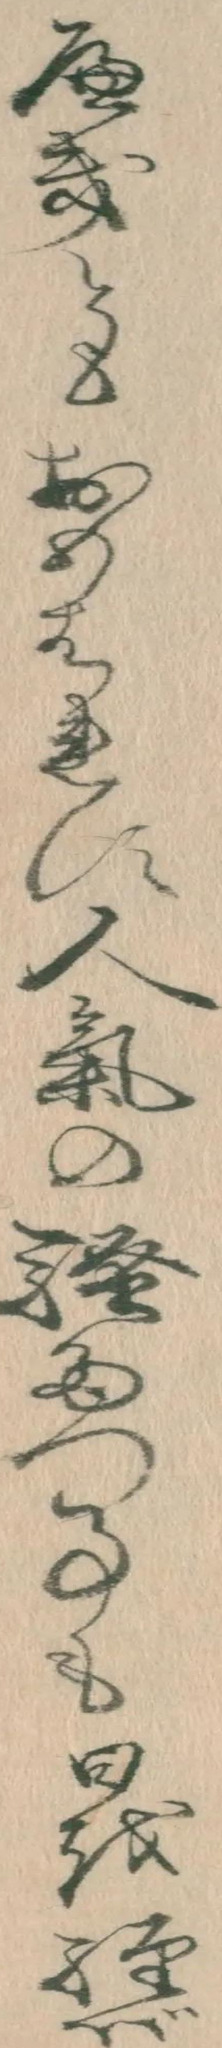へきともおもはれす人気の騒たつ事も日を経ば
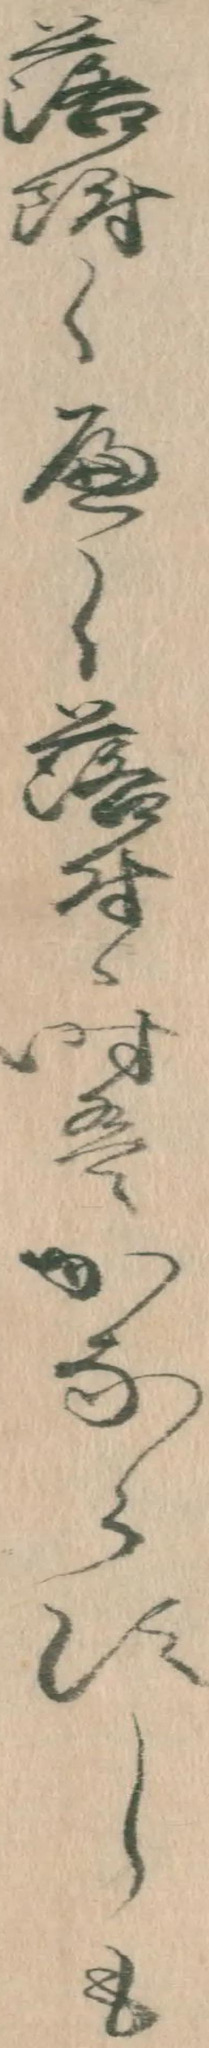落附くへし落付く時はかならすしも
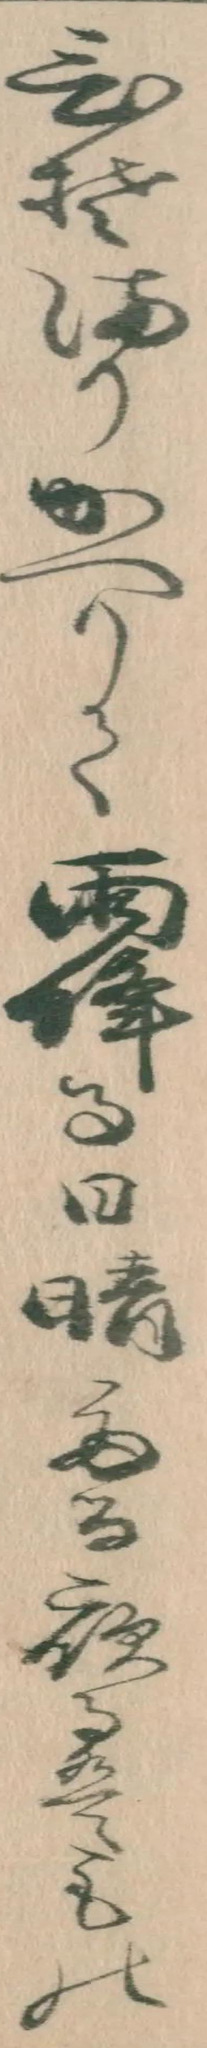ひそまりかへりて雨降る日晴たる夜るはもの
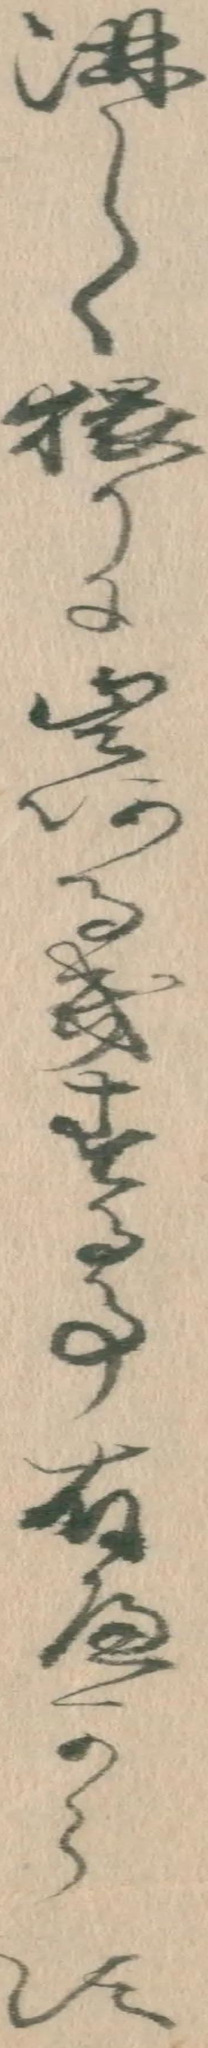淋しく猥りに出あるきする事有へからす
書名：俗語之種. [6]
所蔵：国立国会図書館 National Diet Library, JAPAN
